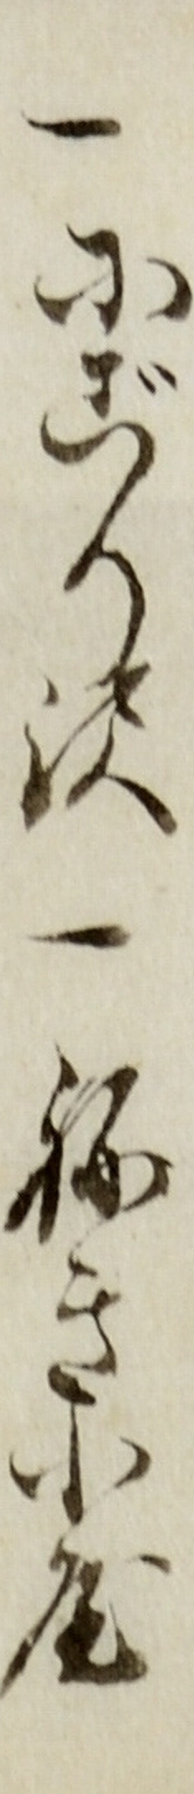一にごり沢一ねき小屋
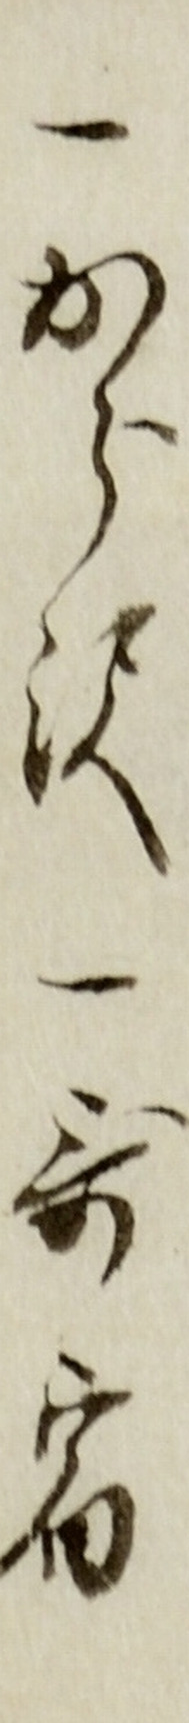一から沢一哥宿
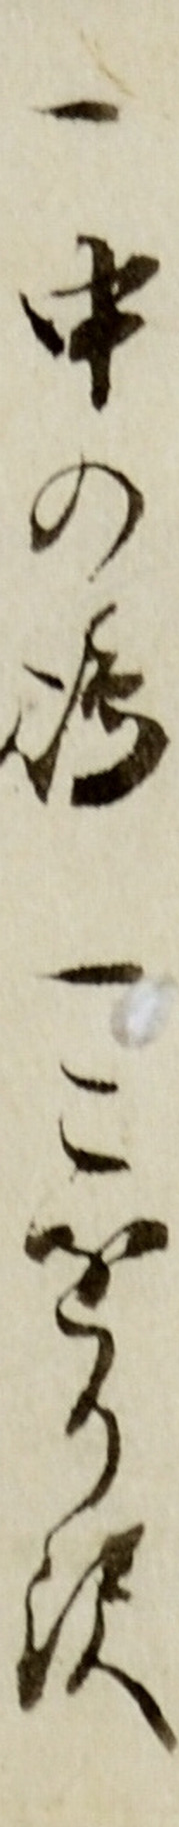一中の嶋一こをり沢
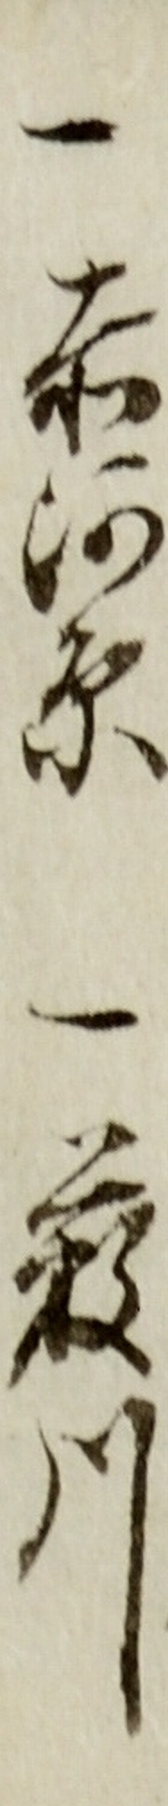一赤河原一薮川
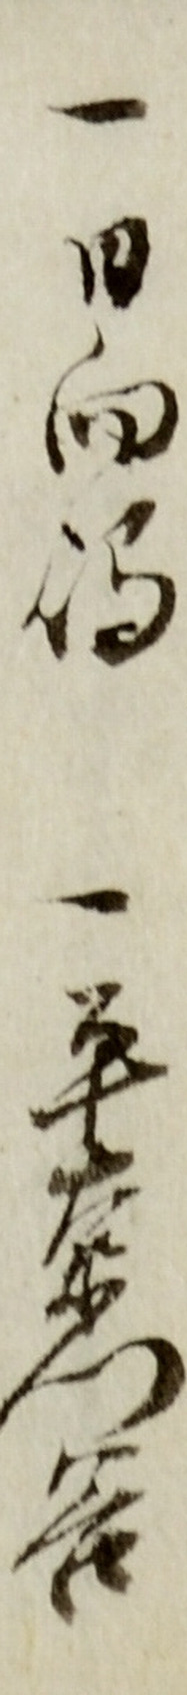一日向嶋一草右衛門谷
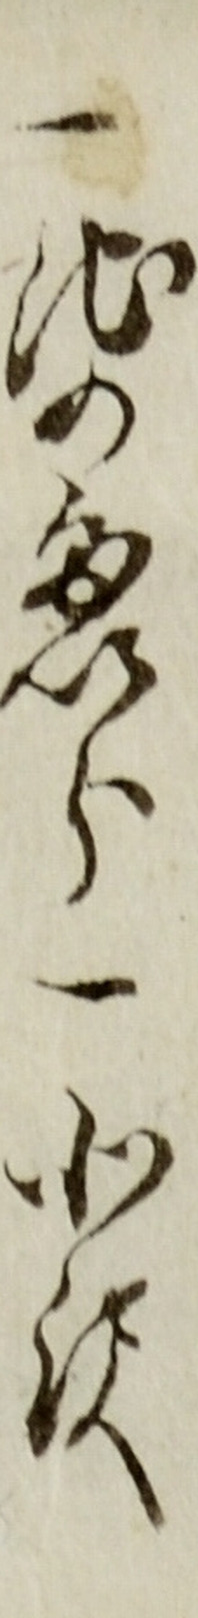一池のたいら一北沢
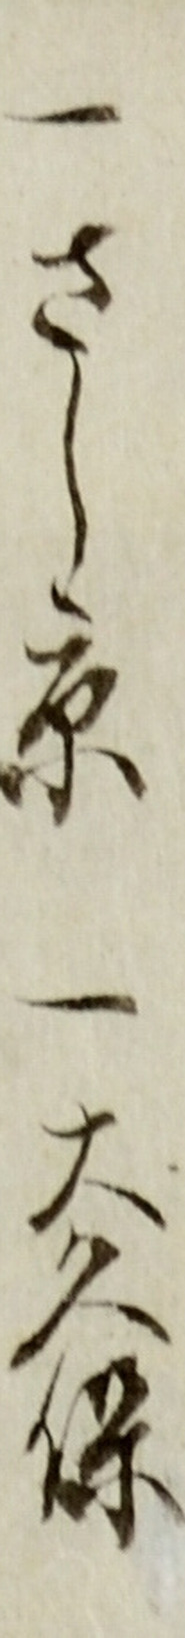一さし京一大久保
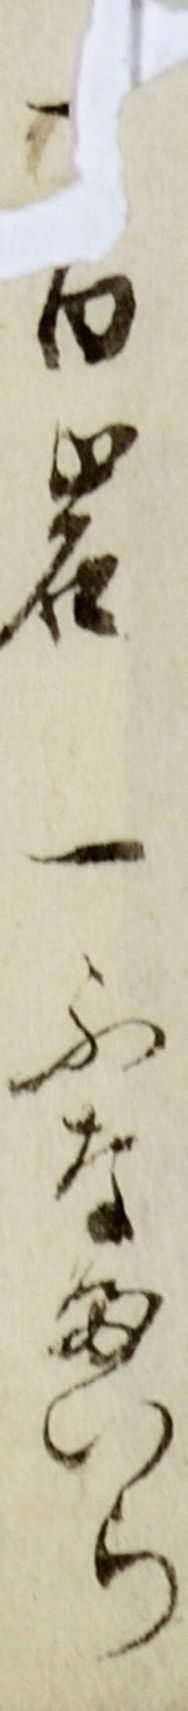一白岩一ふなたいら
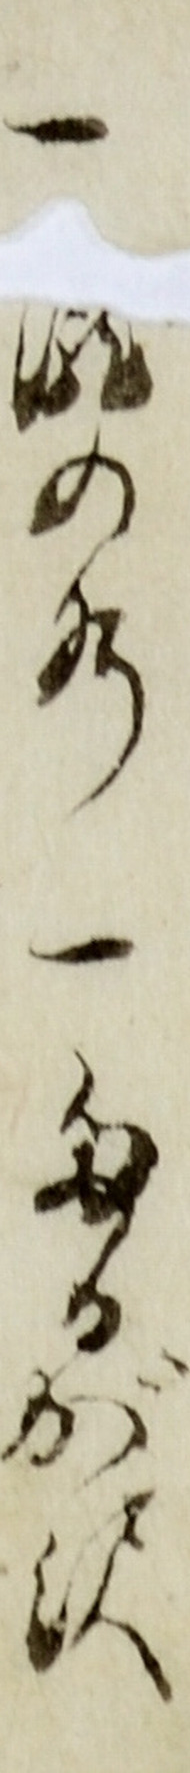一瀧の水一たるが沢
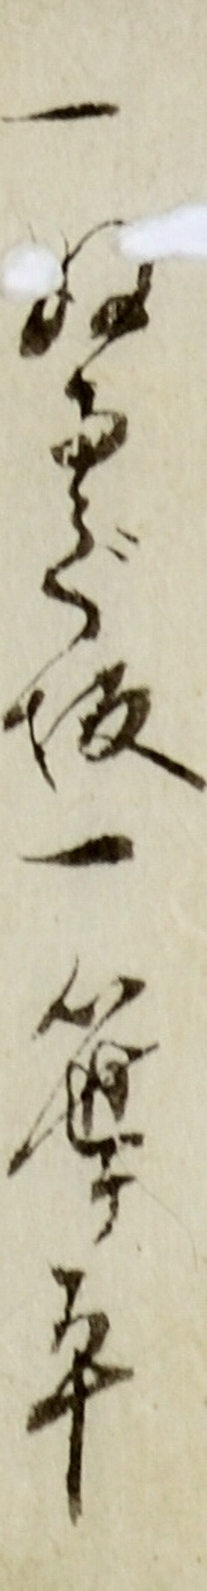一ぬるで坂一笹ケ平
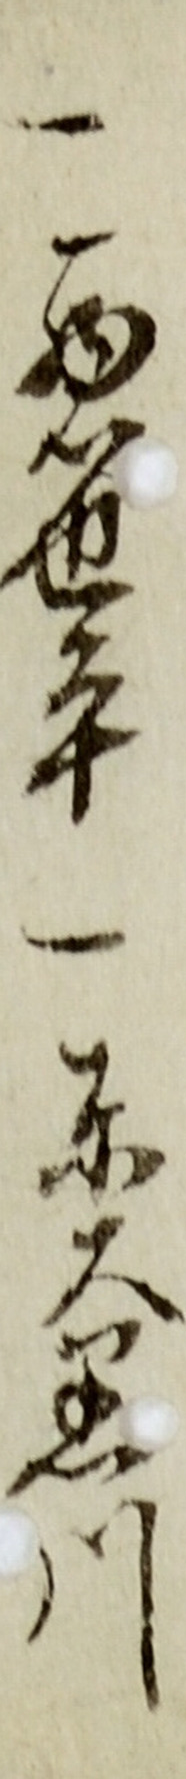一西笹平一東大黒川
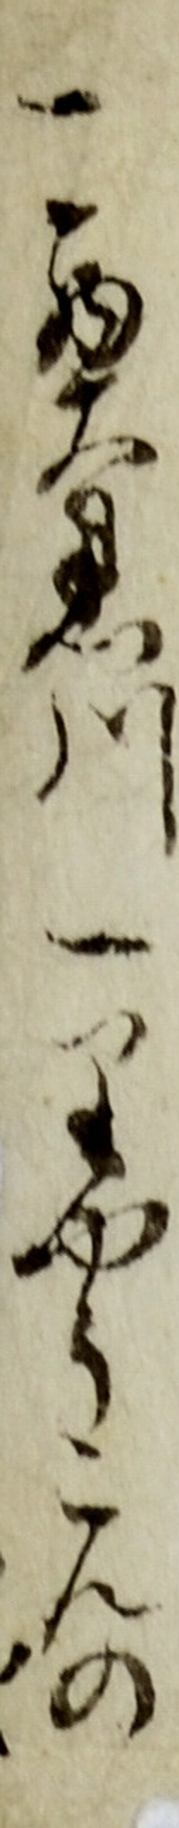一西大黒川一りやうこんの

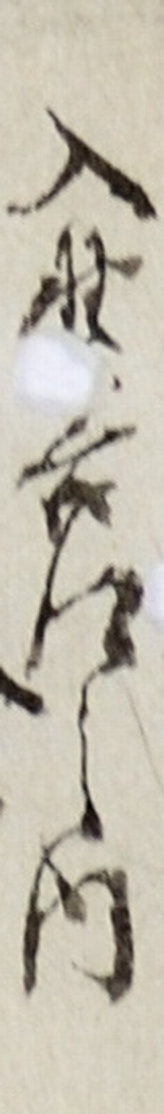入野谷郷之内
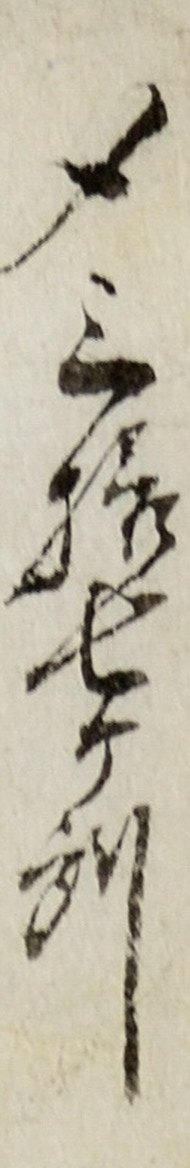〆三拾七ケ所
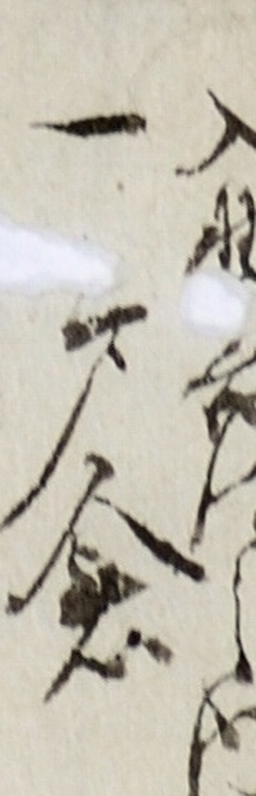一戸倉
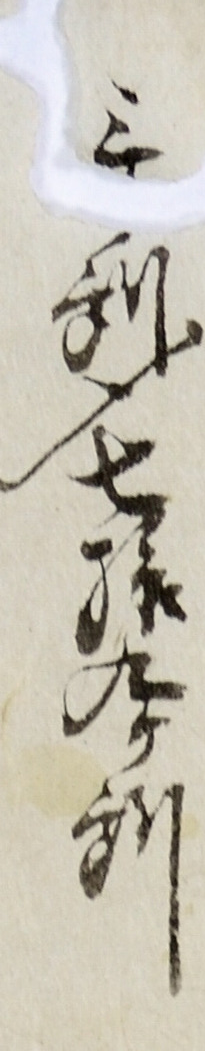三所〆七拾九ケ所
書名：入野谷郷三峯川入御立山名所
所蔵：伊那市立高遠町図書館・合同会社AMANE
